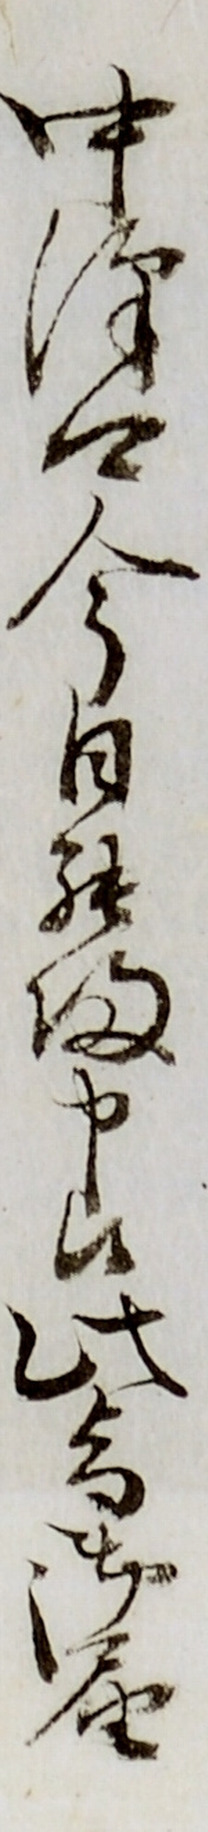中津郷今日罷帰申候此旨御届
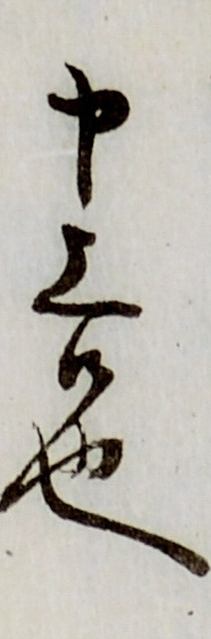申上候也
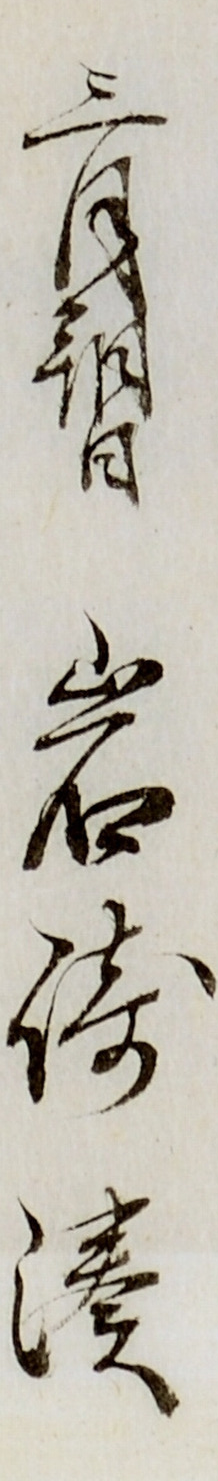三月朔日岩崎湊
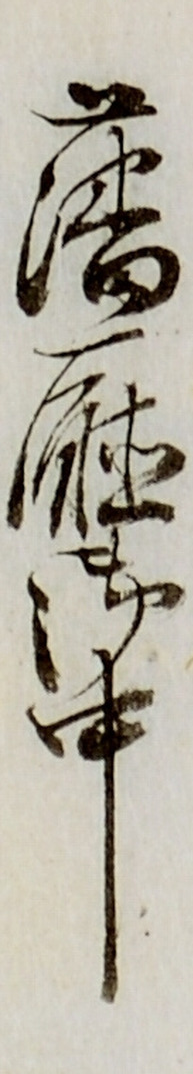藩庁御中
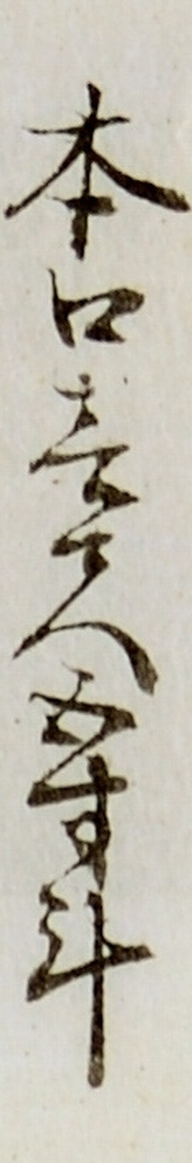本口壱尺五寸計
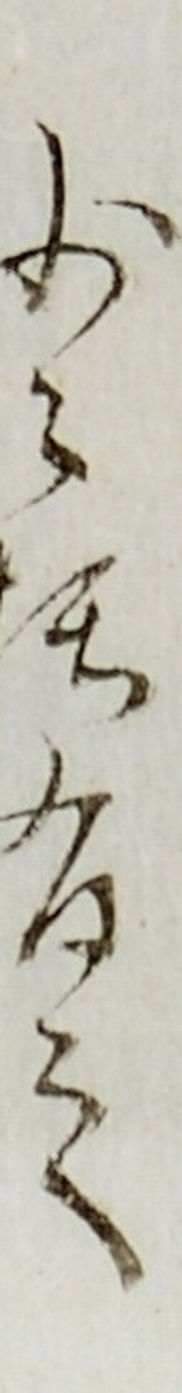少々朽有之
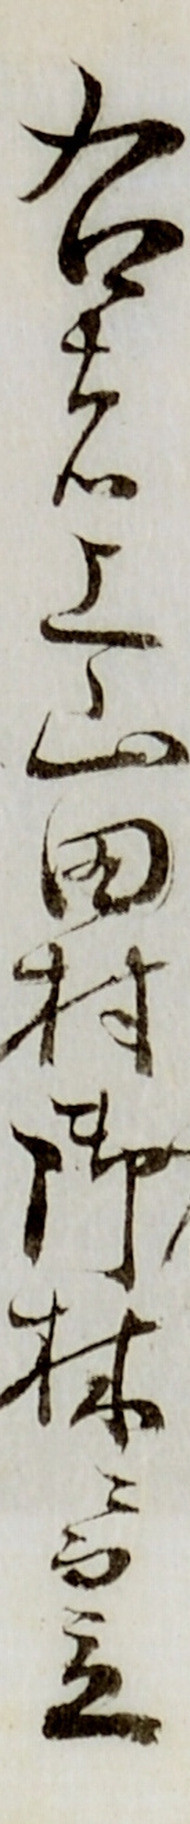右は上山田村御林にて立
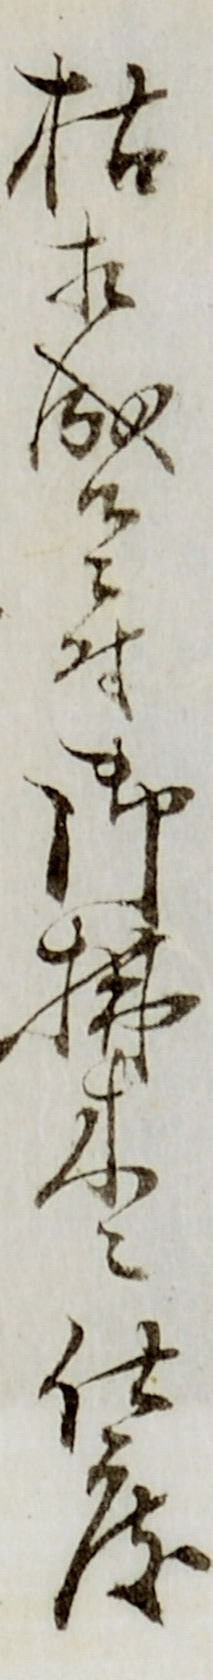枯相成候に付御払木に仕度
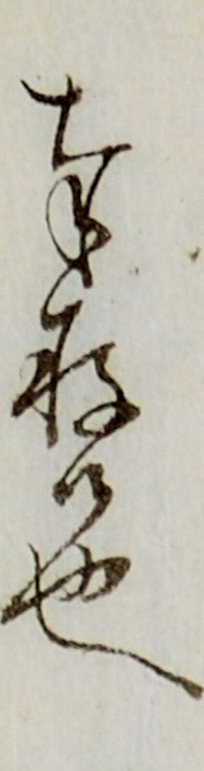奉存候也
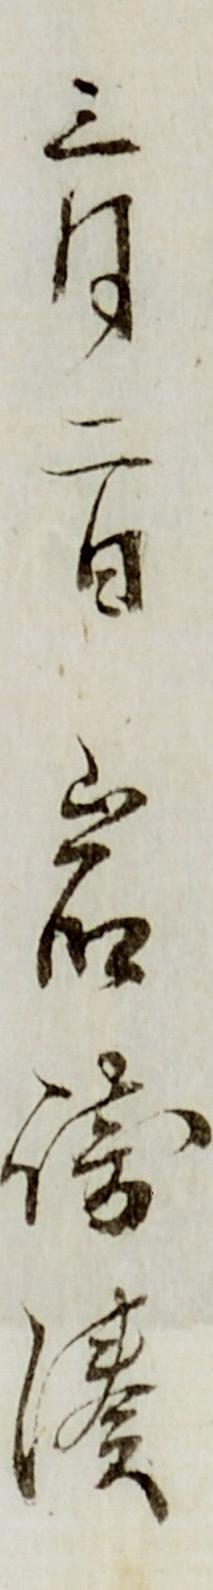三月二日岩崎湊
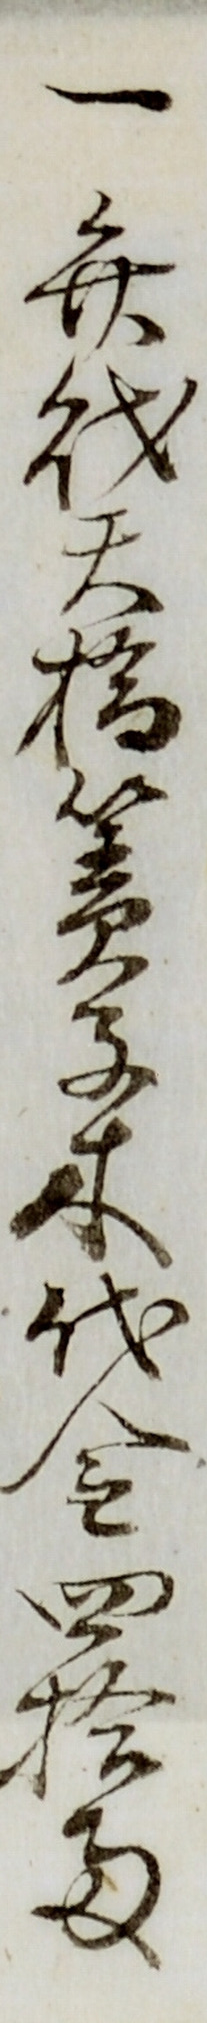一弁財天橋簀子木代金四拾両
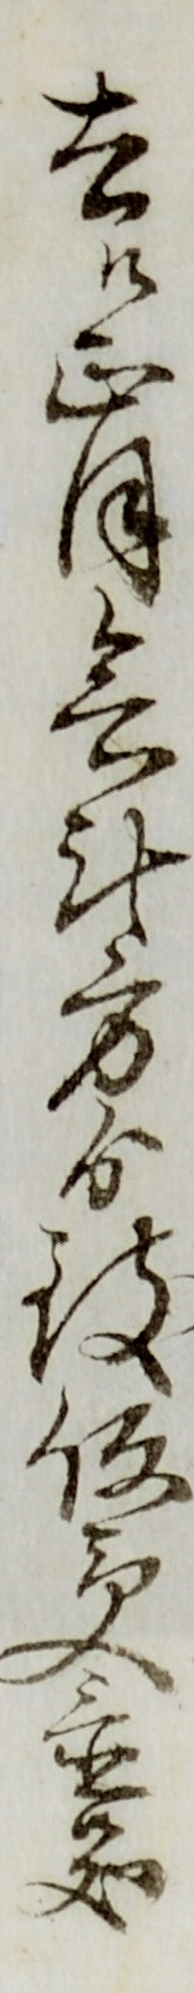去ル正月会計方ゟ致仮受置候処
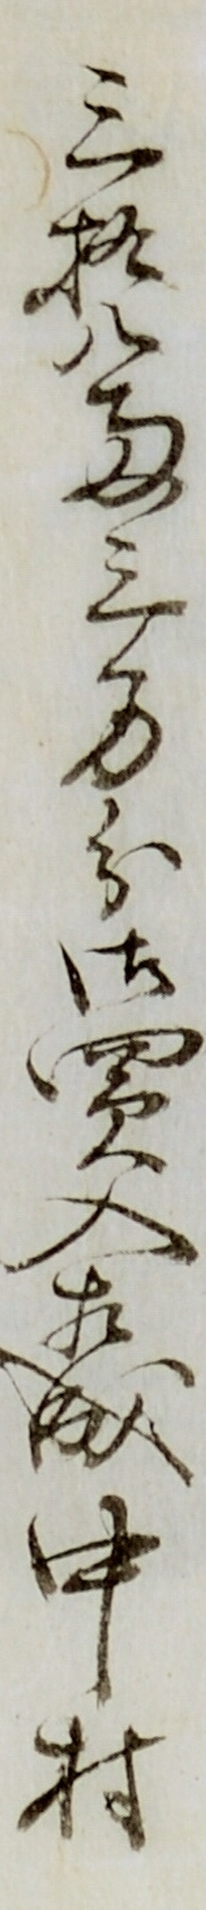三拾八両三分分御買入相成中村
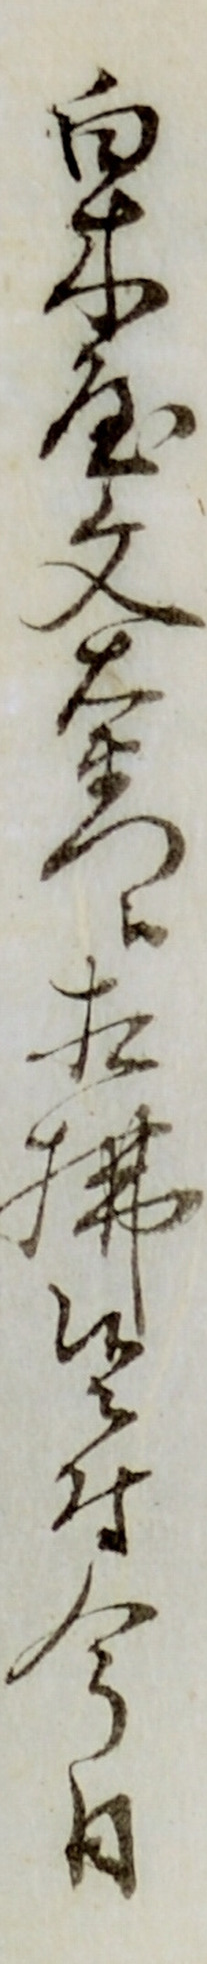白木屋文右衛門え相払候に付今日

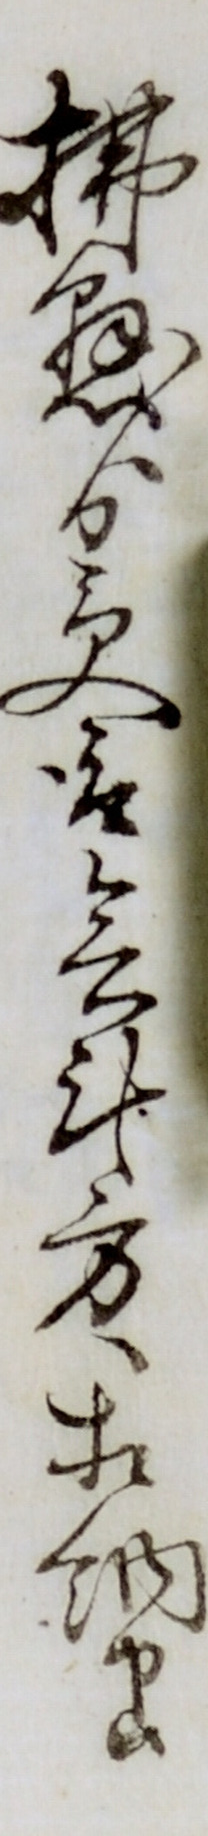払懸ゟ受取会計方へ相納申候
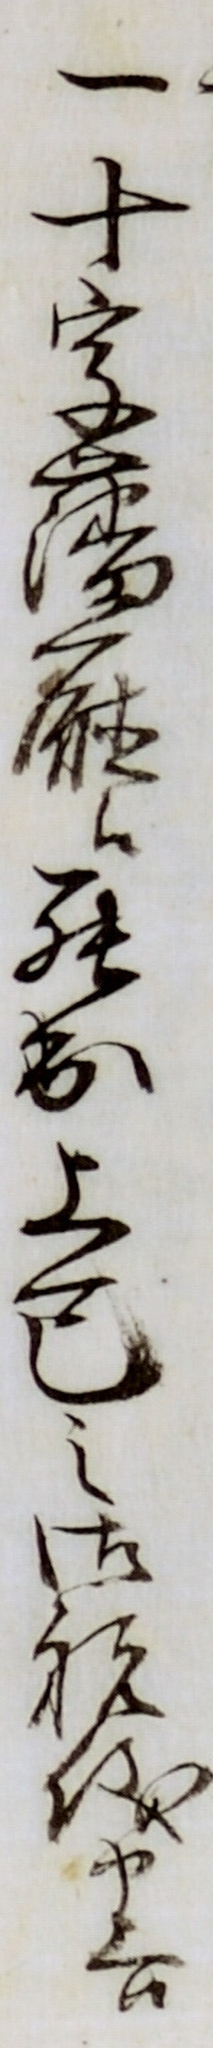一十字藩庁え罷出上巳之御祝儀申上候
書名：山林方諸事御用留
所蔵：伊那市立高遠町図書館・合同会社AMANE
